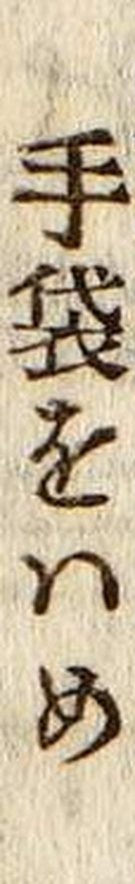手袋をはめ
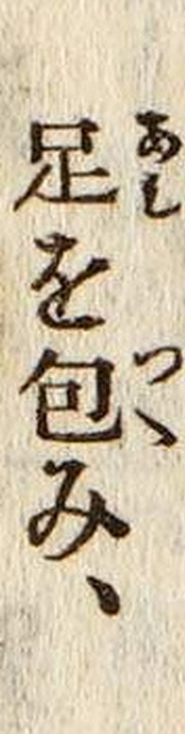足を包み、
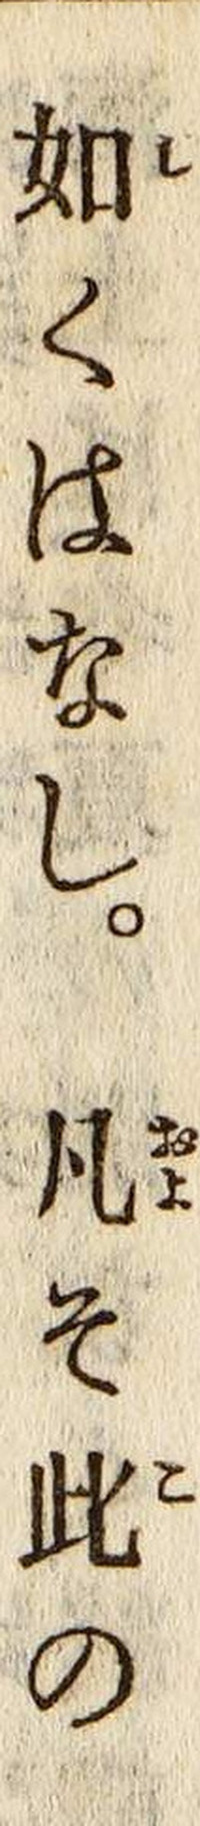如くはなし。凡そ此の
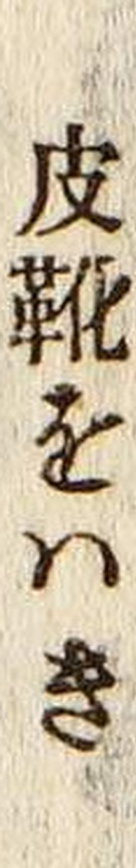皮靴をはき
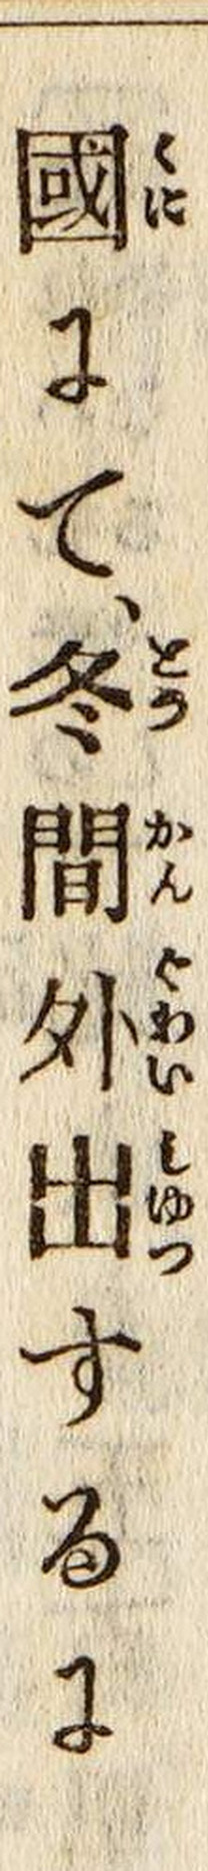国にて、冬間外出するに
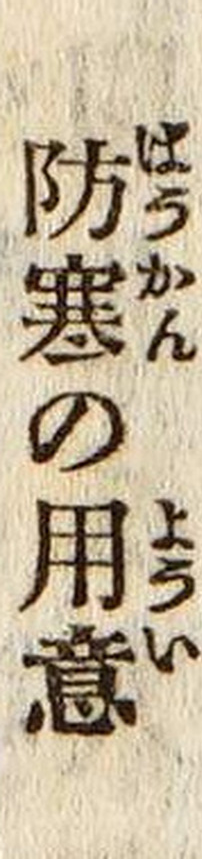防寒の用意
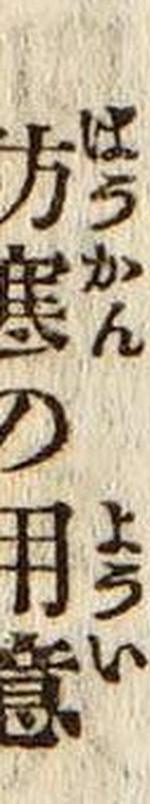防寒の用意
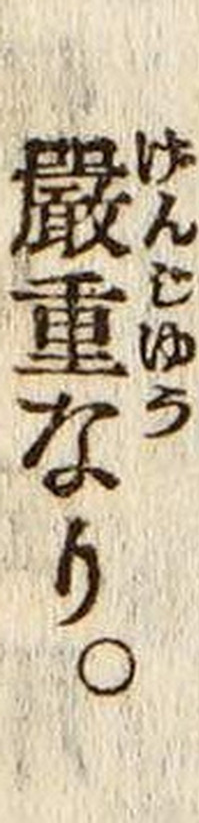厳重なり。
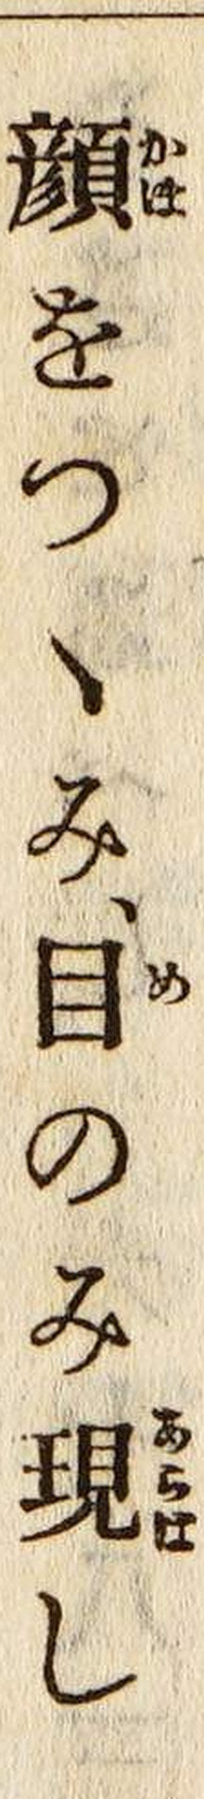顔をつゝみ、目のみ現し
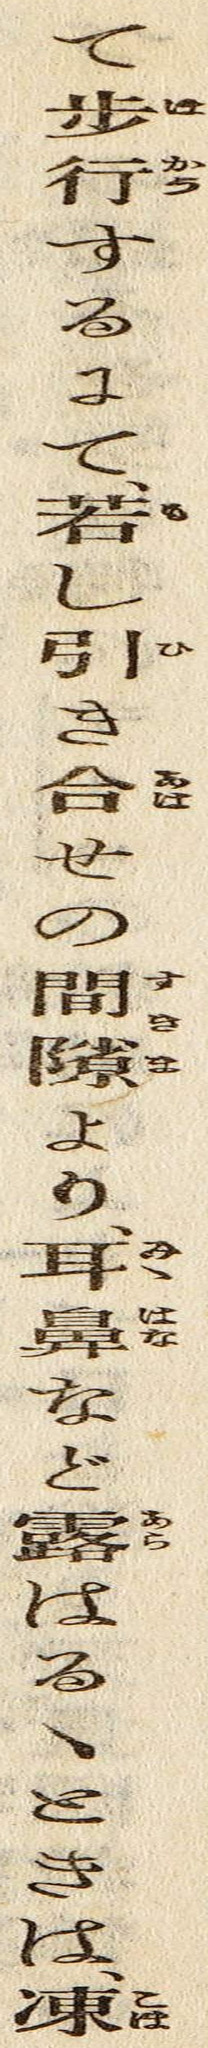て歩行するにて、若し引き合せの間隙より、耳鼻など露はるゝときは、凍
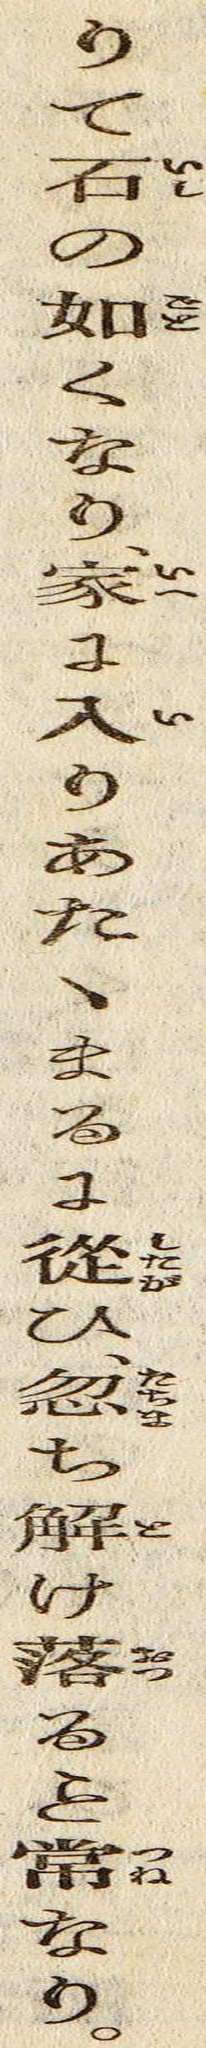りて石の如くなり、家に入りあたゝまるに従ひ、忽ち解け落ること常なり。
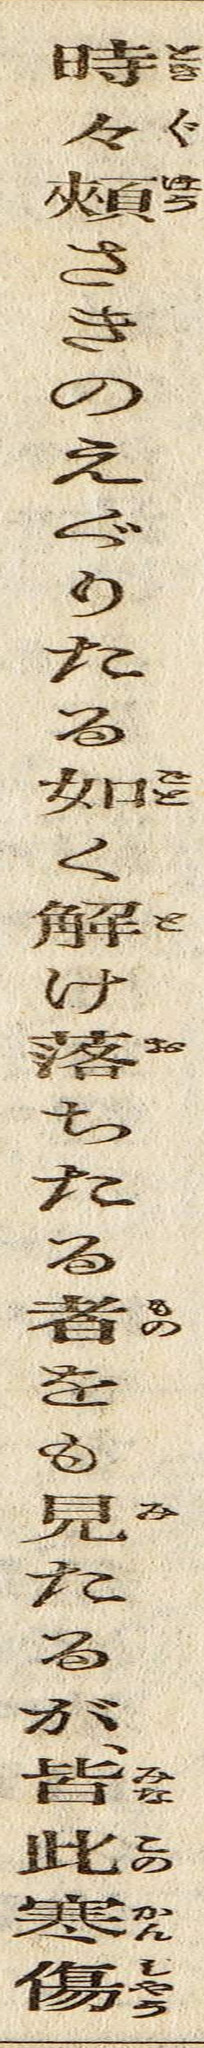時々頬さきのえぐりたる如く解け落ちたる者をも見たるが、皆此寒傷
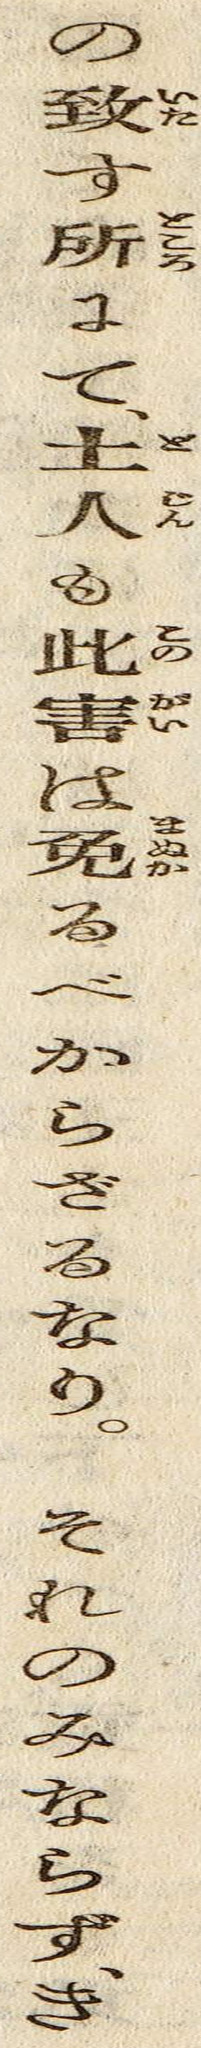の致す所にて、土人も此害は免るべからざるなり。それのみならず、き
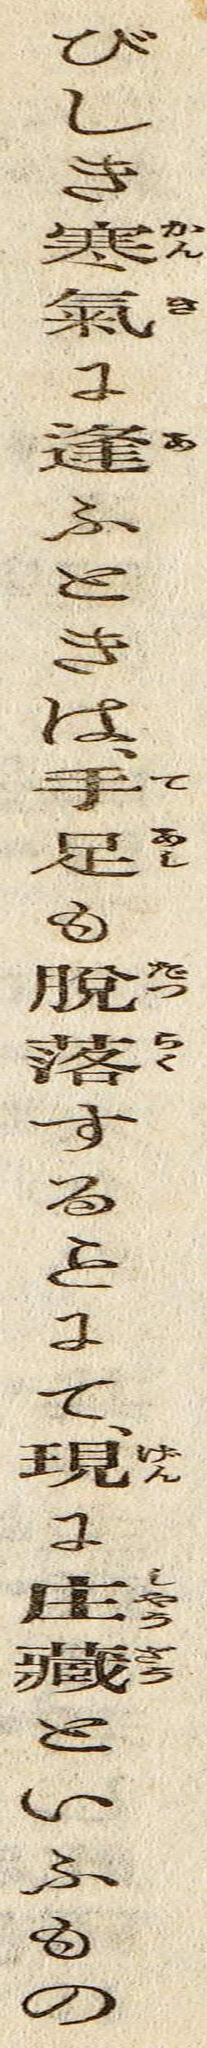びしき寒気に逢ふときは、手足も脱落することにて、現に庄蔵といふもの
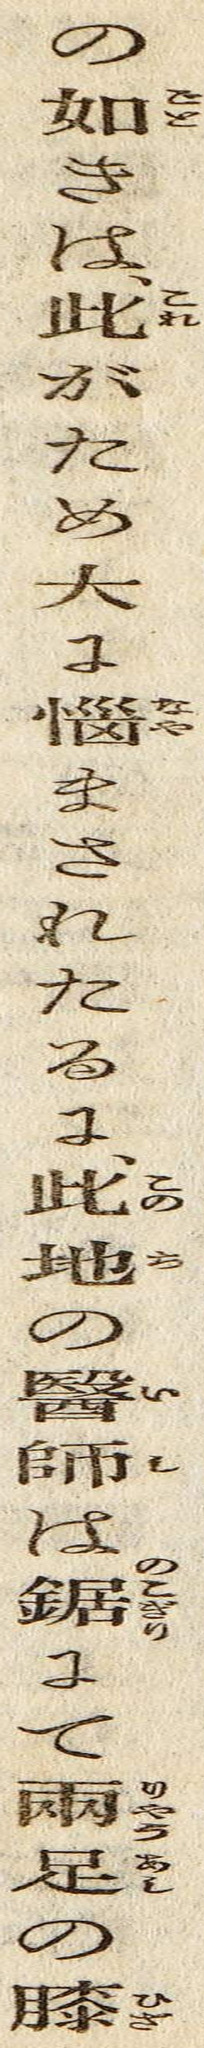の如きは、此がため大に悩まされたるに、此地の医師は鋸にて両足の膝
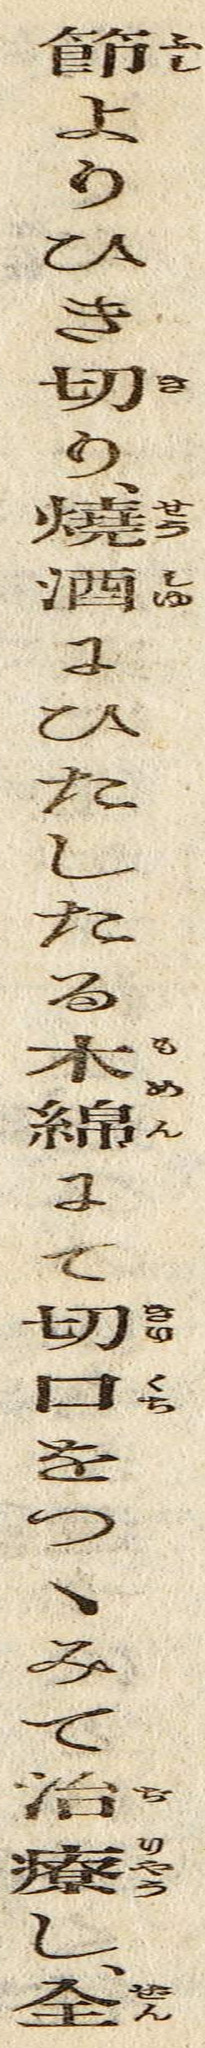節よりひき切り、焼酎にひたしたる木綿にて切口をつゝみて治療し、全
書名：日本漂流譚
